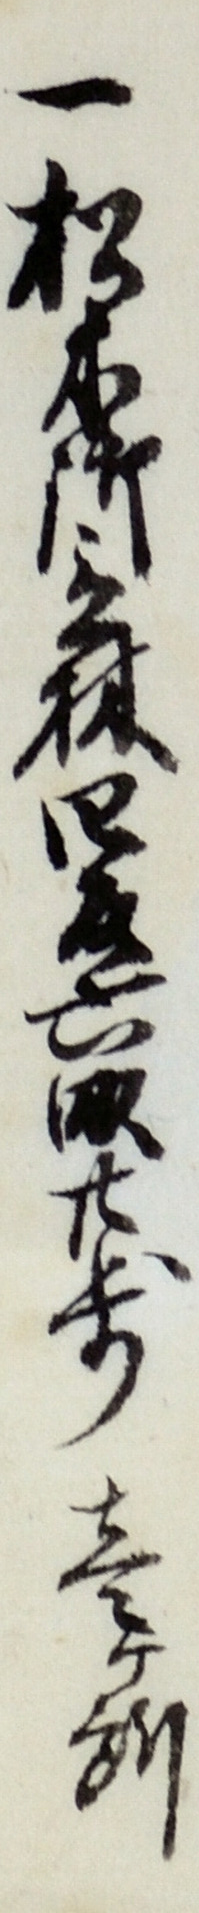一松木御立林四反六畝廿歩壱ヶ所
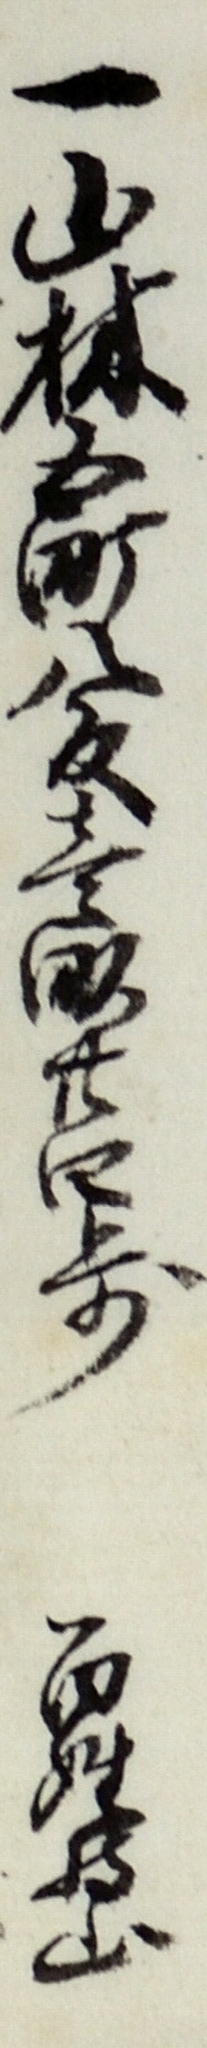一山林五町八反壱畝廿四歩百姓持山
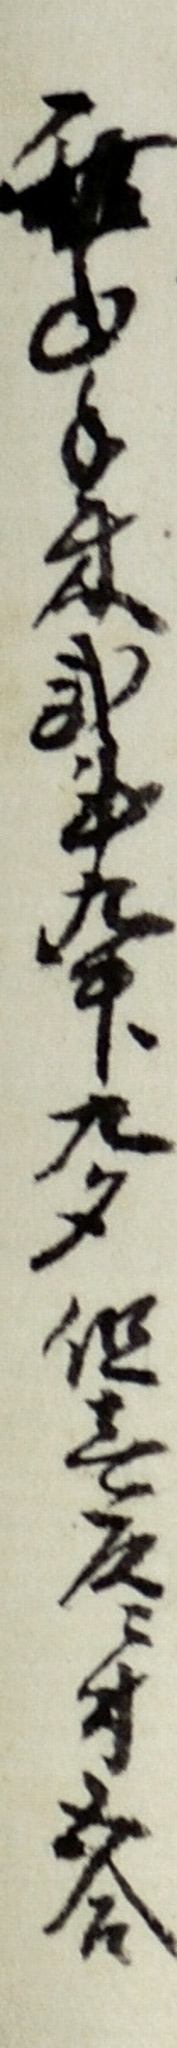此山手米弐斗九升九夕但壱反ニ付五合
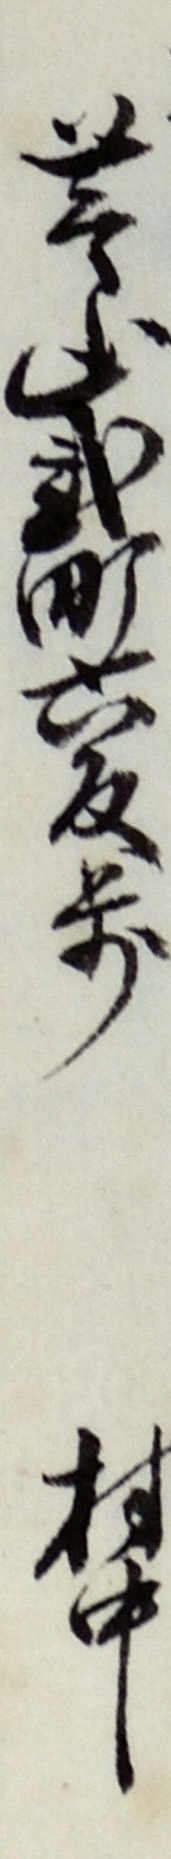芝山弐町六反歩村中
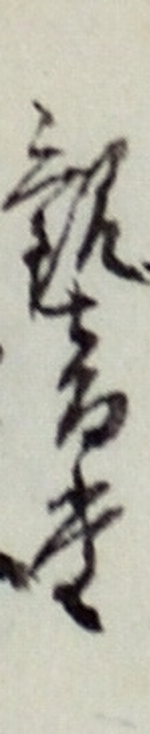観音堂
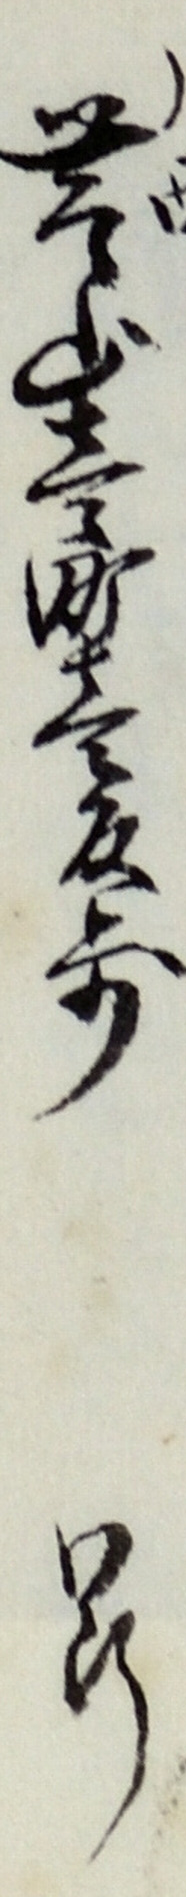芝山壱町壱反歩同断
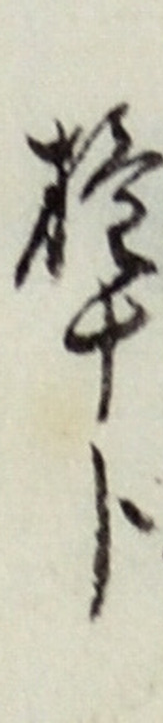権十郎
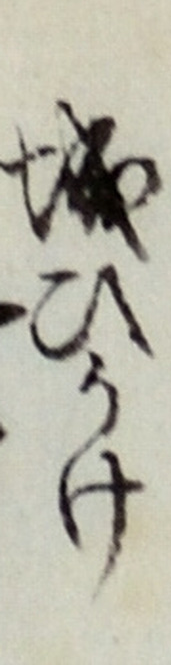城ひかけ
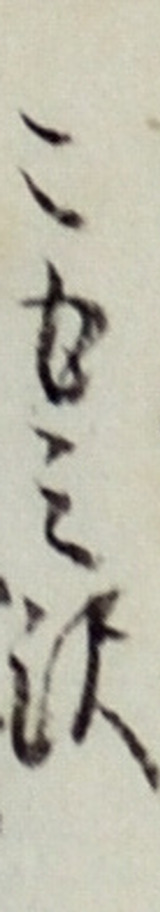こもみ沢
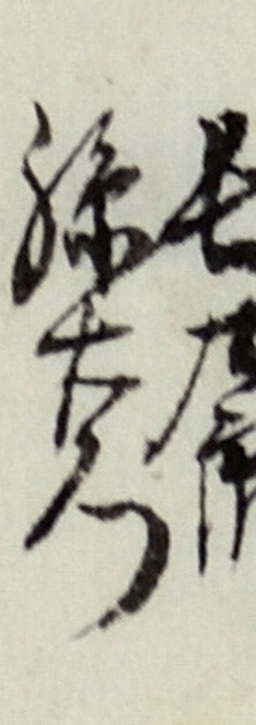源右衛門
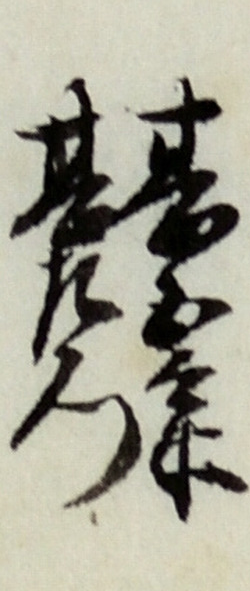甚左衛門
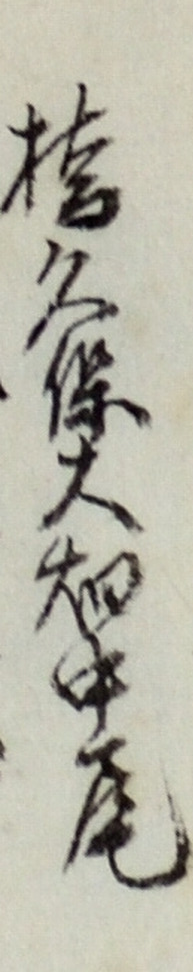橋久保大畑中尾
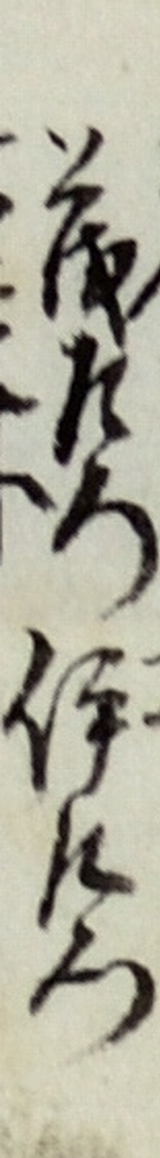茂左衛門伊左衛門
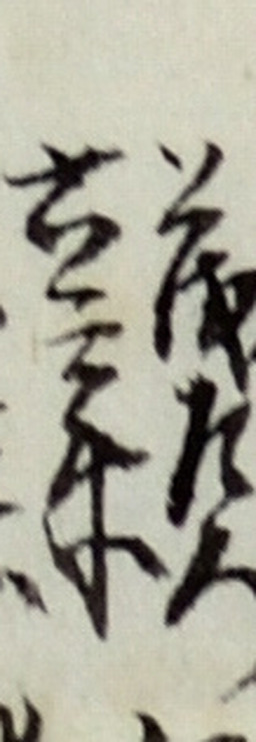六兵衛
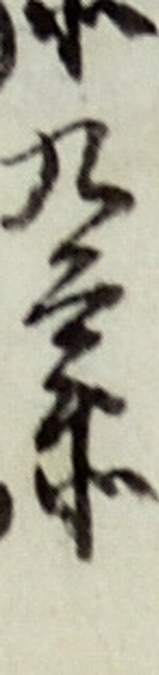六兵衛
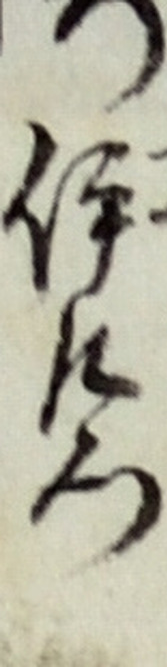甚左衛門
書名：御領分中山林社地手控
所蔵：伊那市立高遠町図書館・合同会社AMANE
